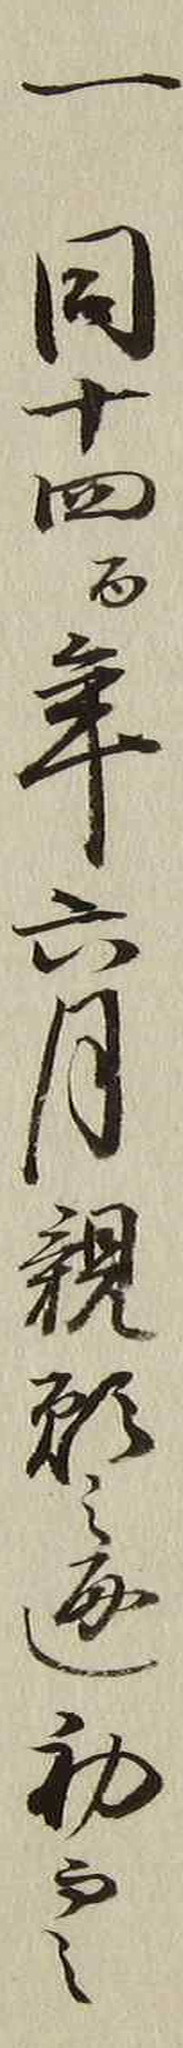一同十四酉年六月親願之通初而之
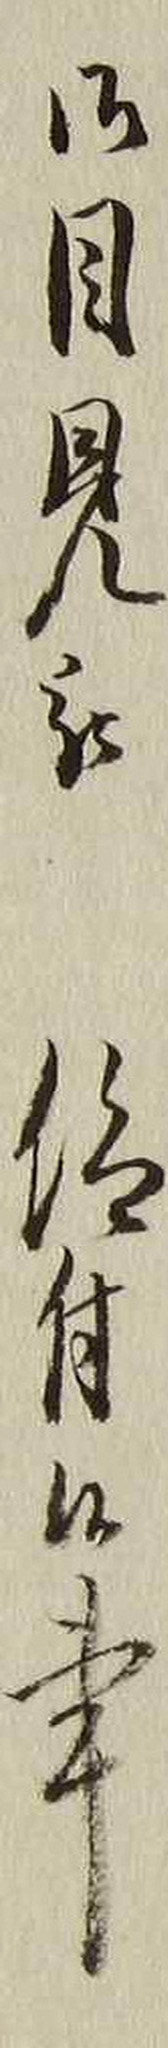御目見被仰付候事
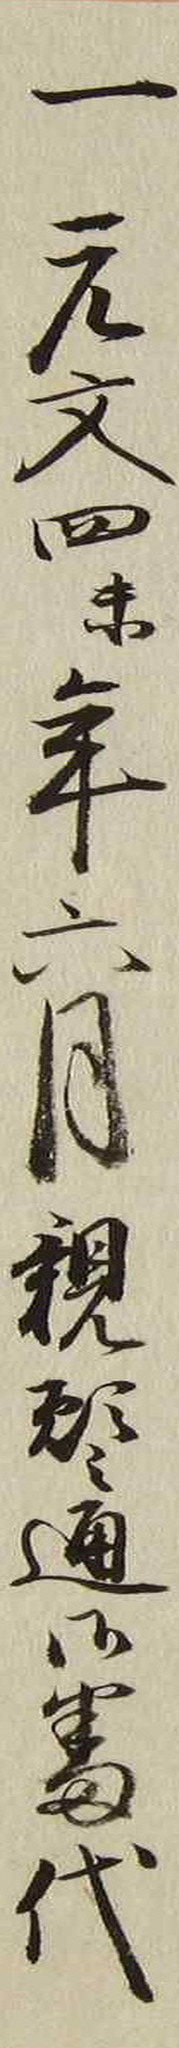一元文四未年六月親願之通御番代
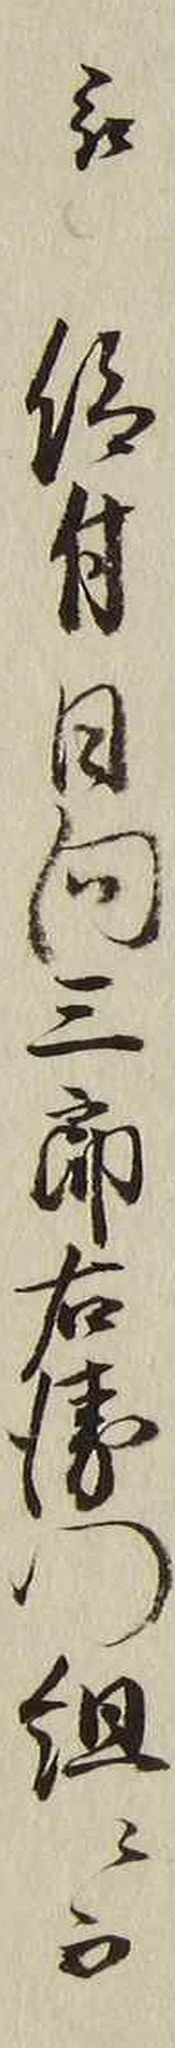被仰付日向三郎右衛門組ニ而
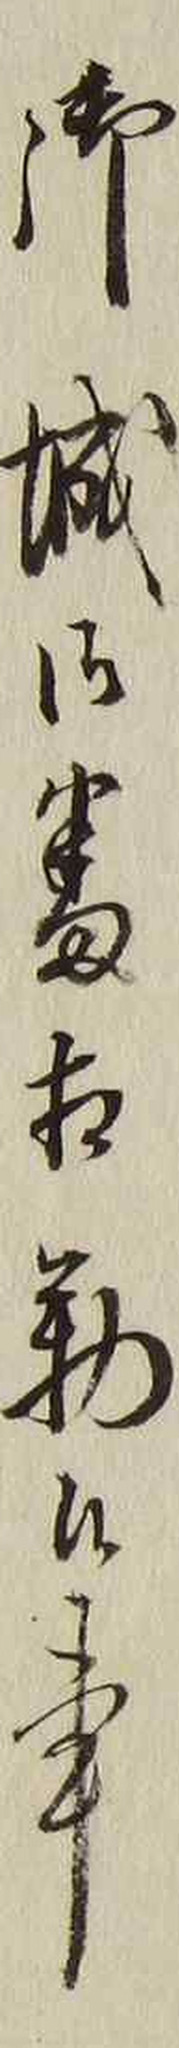御城御番相勤候事
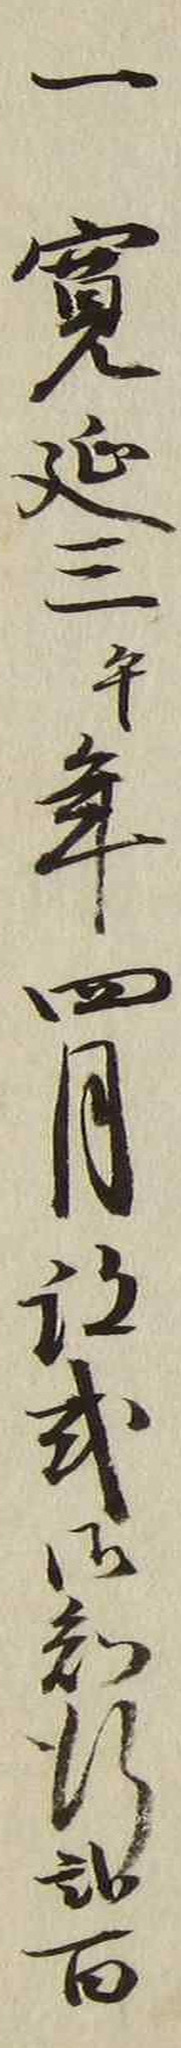一寛延三午年四月跡式御知行弐百

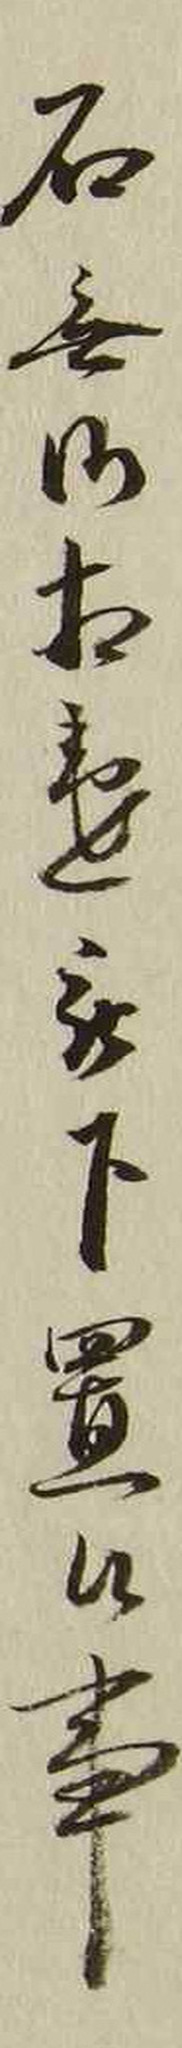石無御相違被下置候事
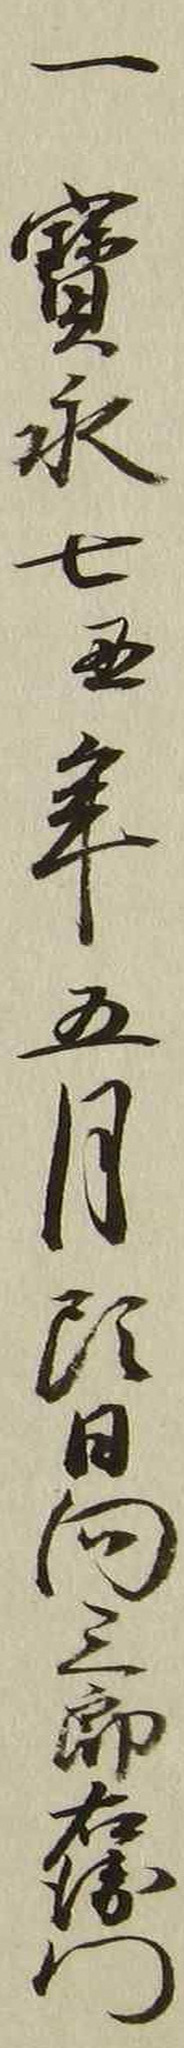一宝永七丑年五月頭日向三郎右衛門
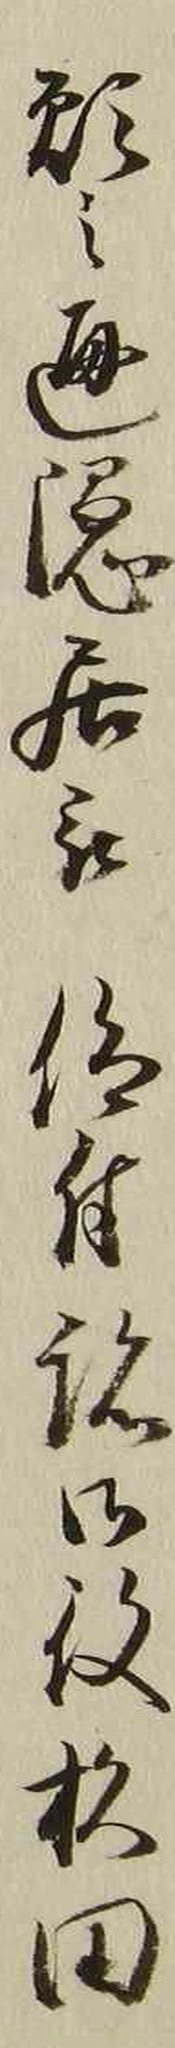願之通隠居被仰付跡御役杉田
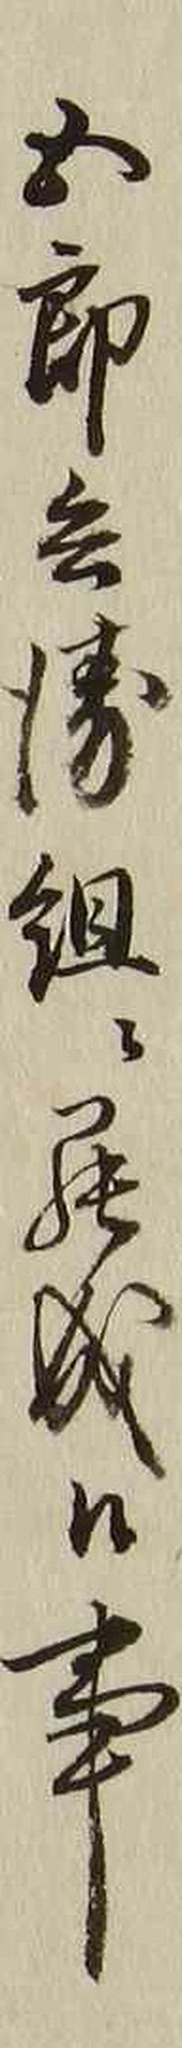五郎兵衛組ニ罷成候事
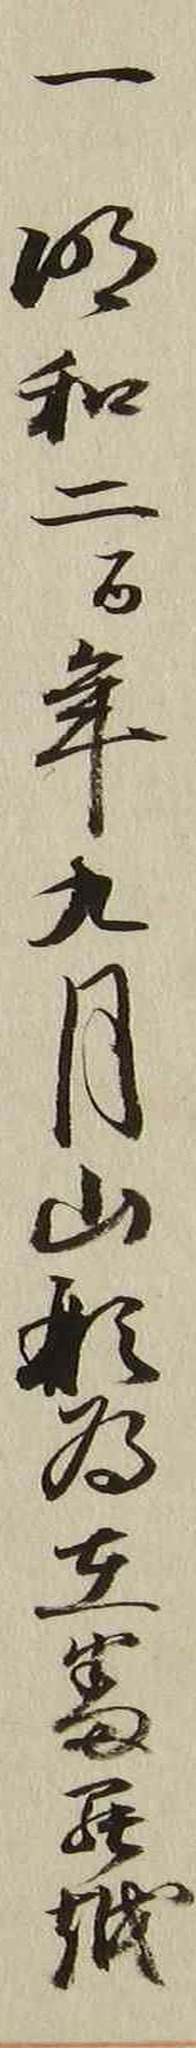一明和二酉年九月山形為在番罷越
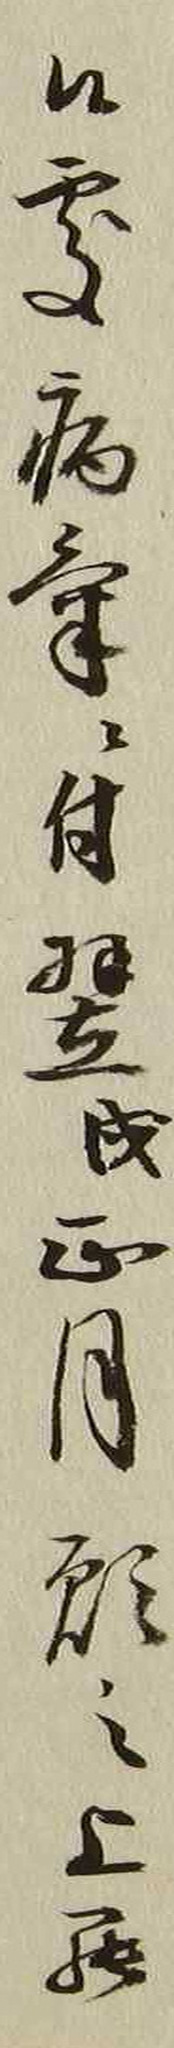候処病気二付翌戌正月願之上罷
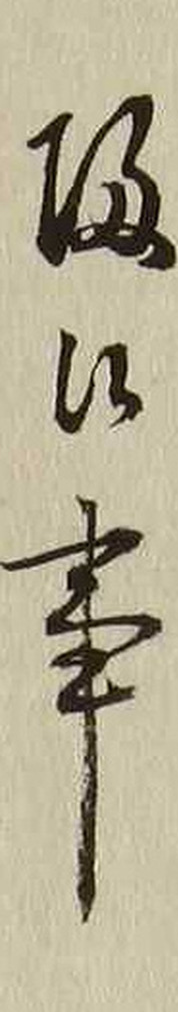帰候事
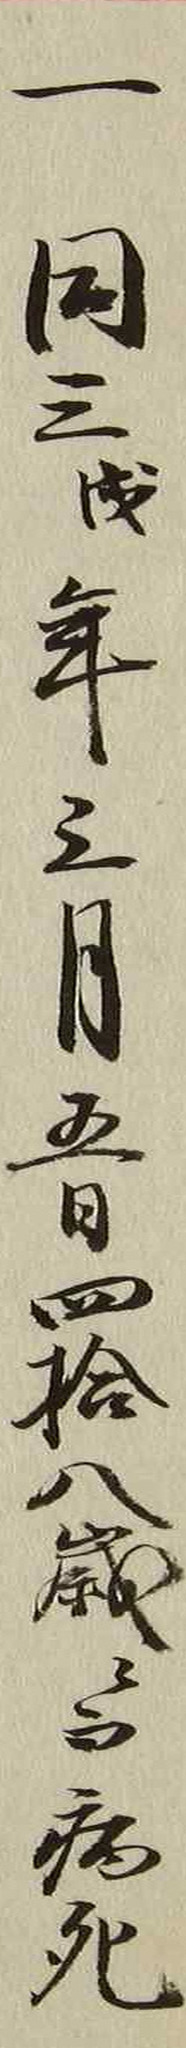一同三戌年三月五日四拾八歳二而病死
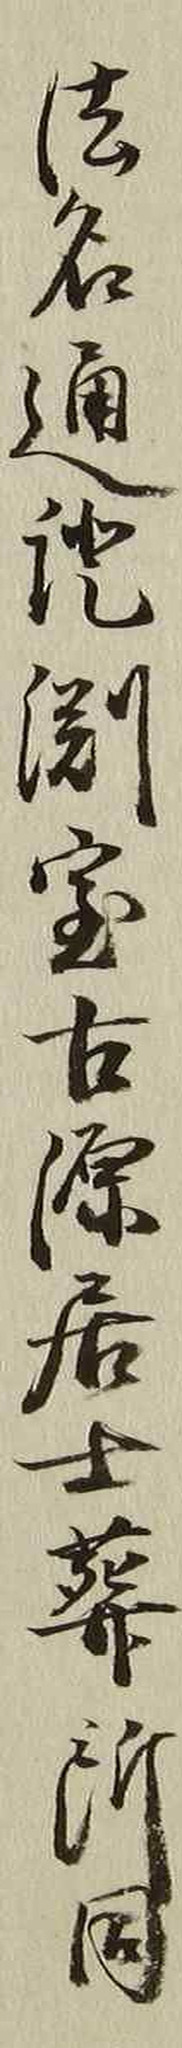法名通証淵宝古源居士葬所同
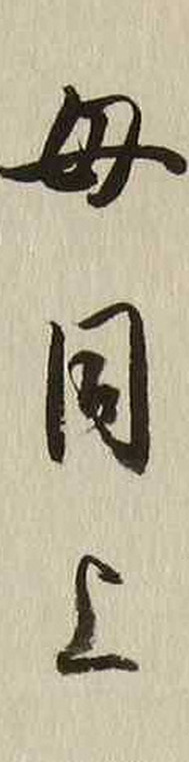母同上
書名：諸士系譜　巻之69　を之部3
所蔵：会津若松市立会津図書館
